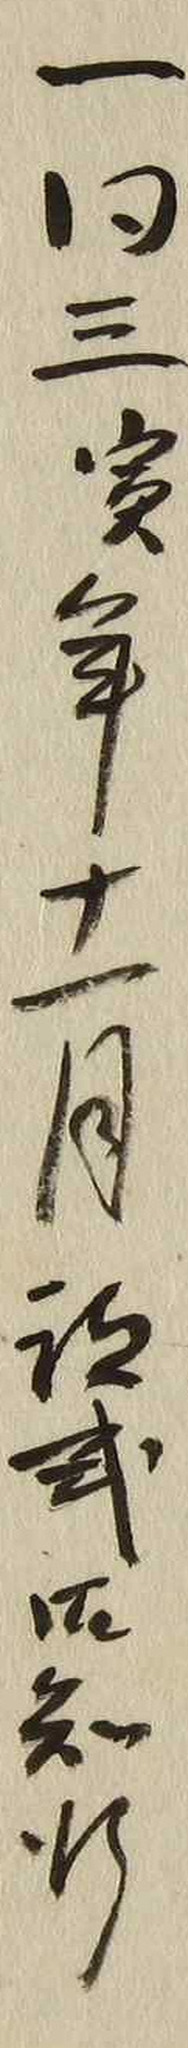一同三寅年十一月跡式御知行
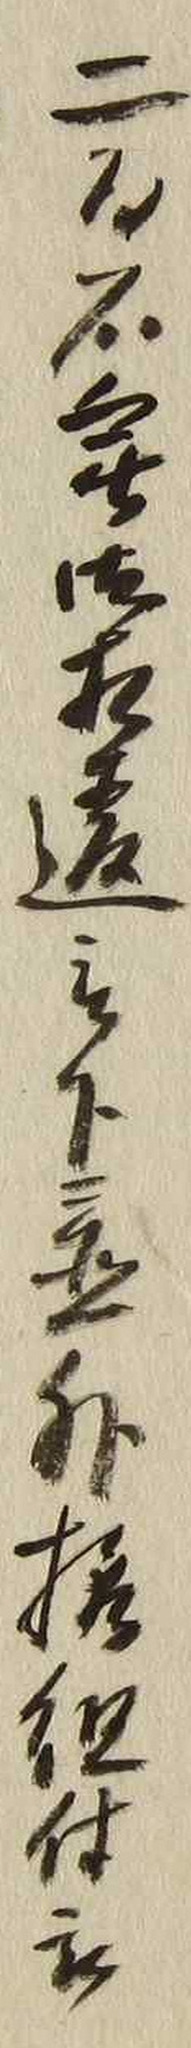二百石無御相違被下置外様組付被
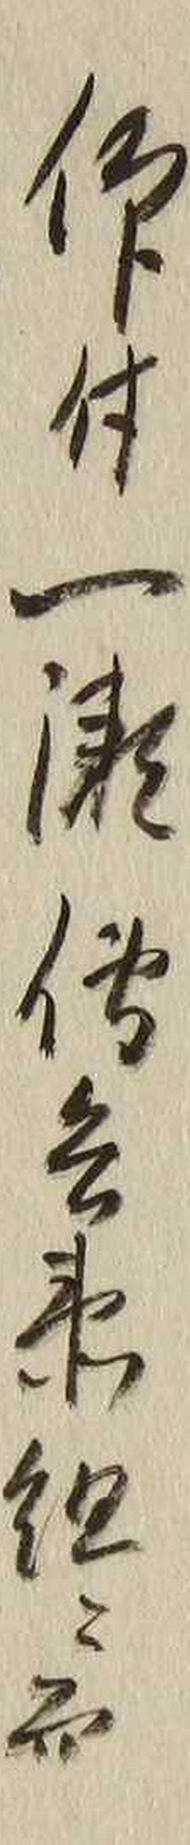仰付一瀬伝兵衛組に而
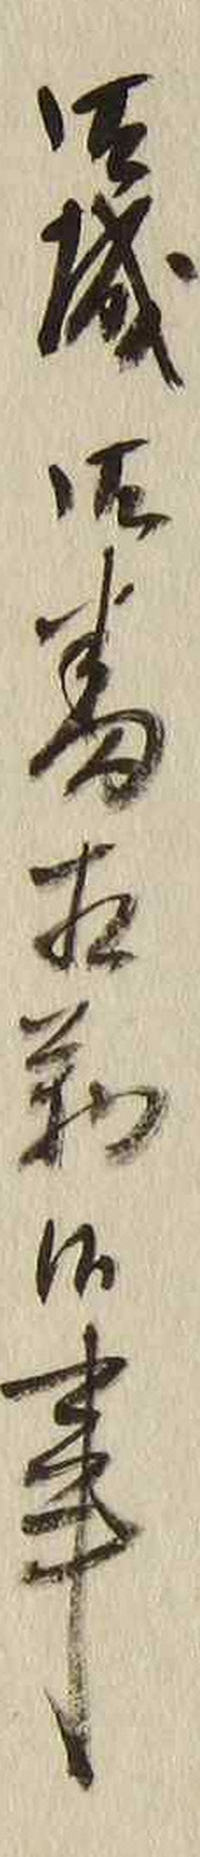御城御番相勤候事
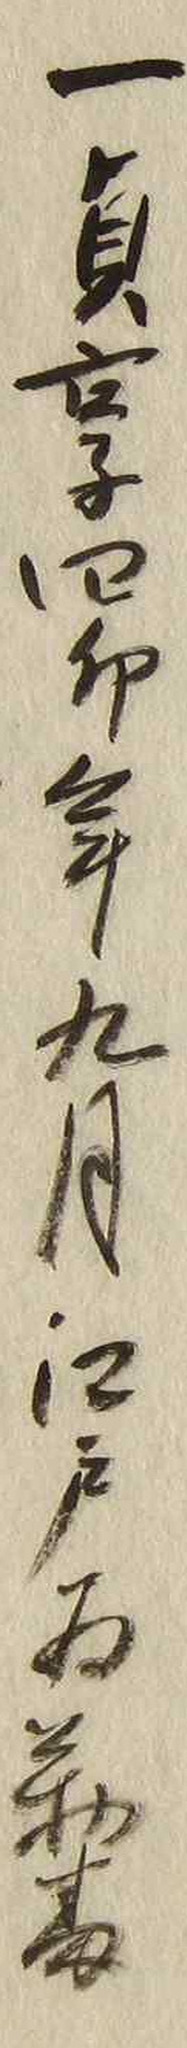一貞享四卯年九月江戸為勤番
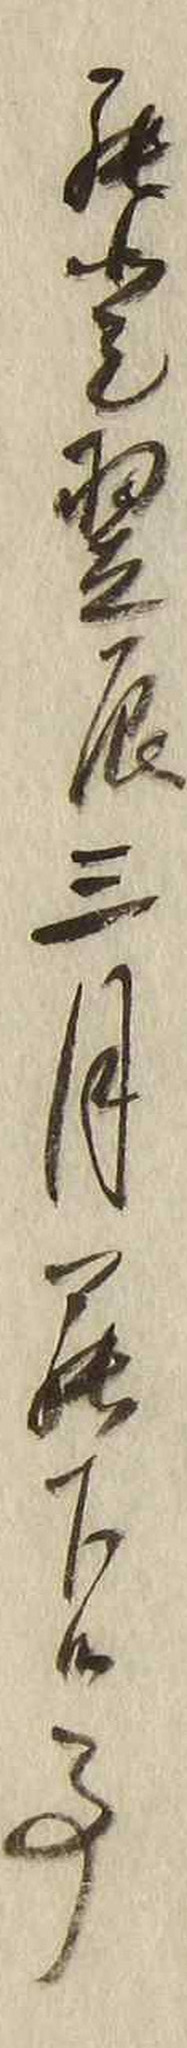罷登翌辰三月罷下候事

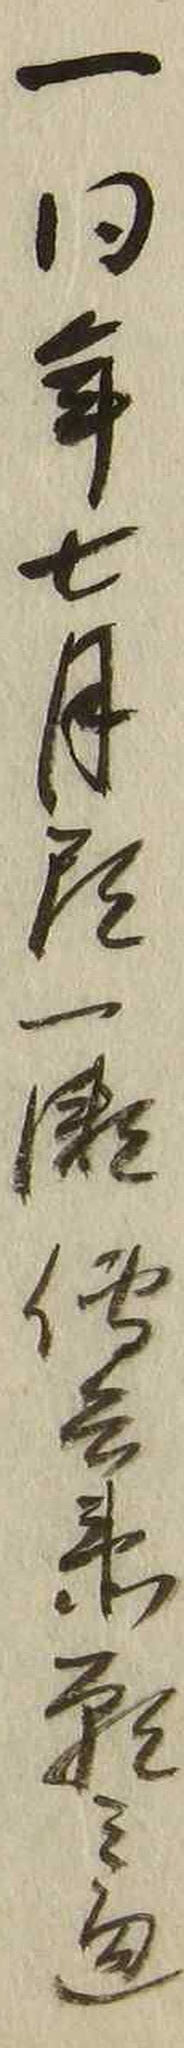一同年七月頭一瀬伝兵衛願之通
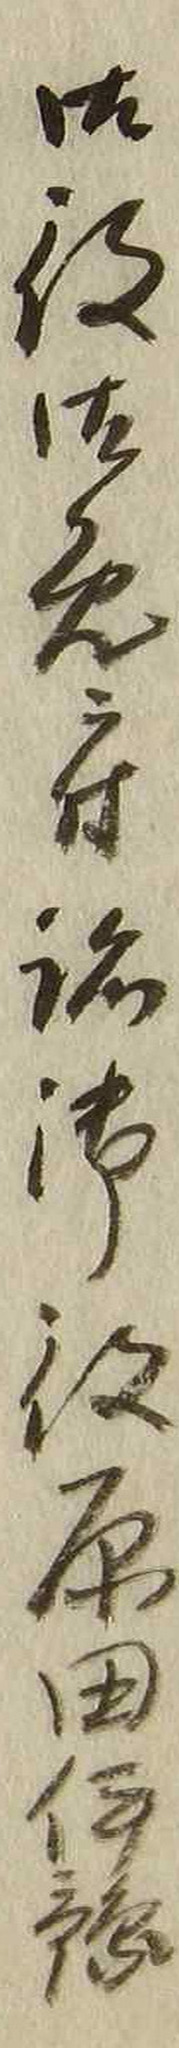御役御免に付跡御役原田伊豫
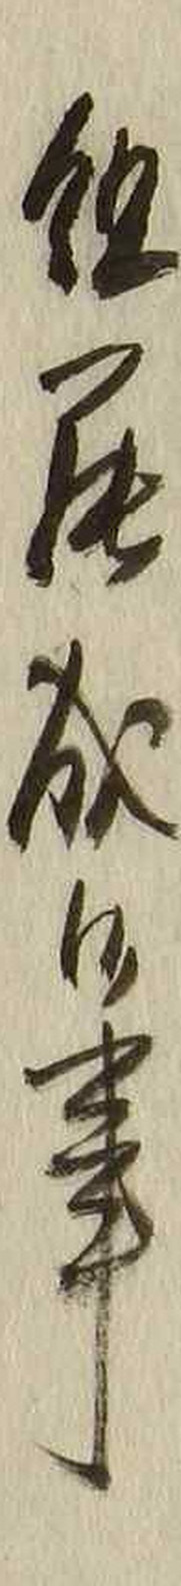組罷成候事
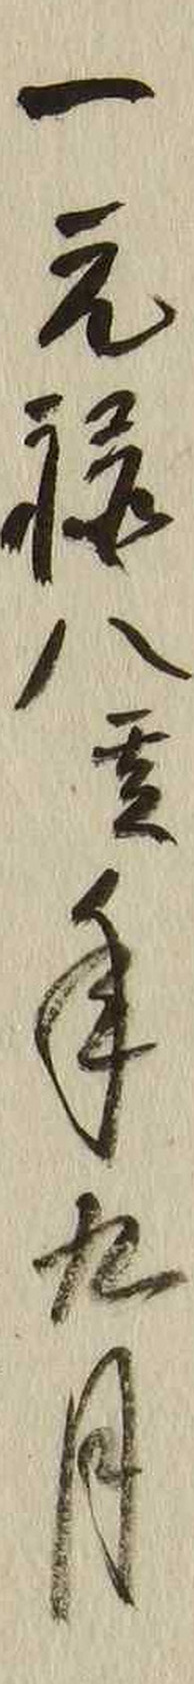一元禄八亥年九月
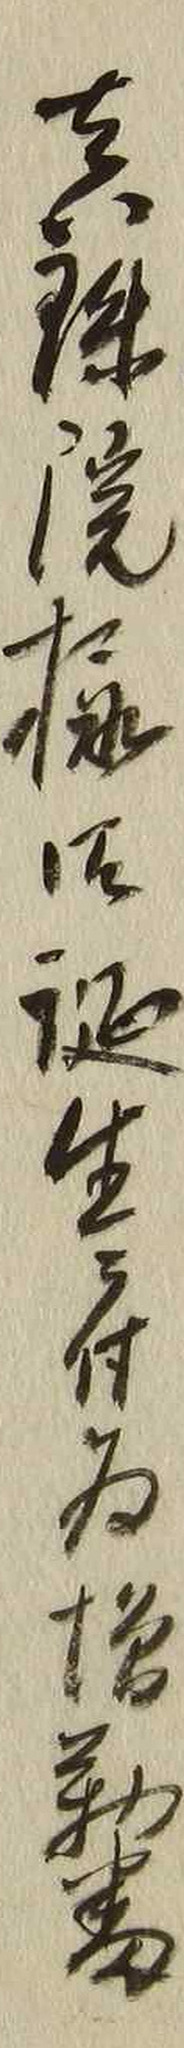真珠院様御誕生に付為増勤番
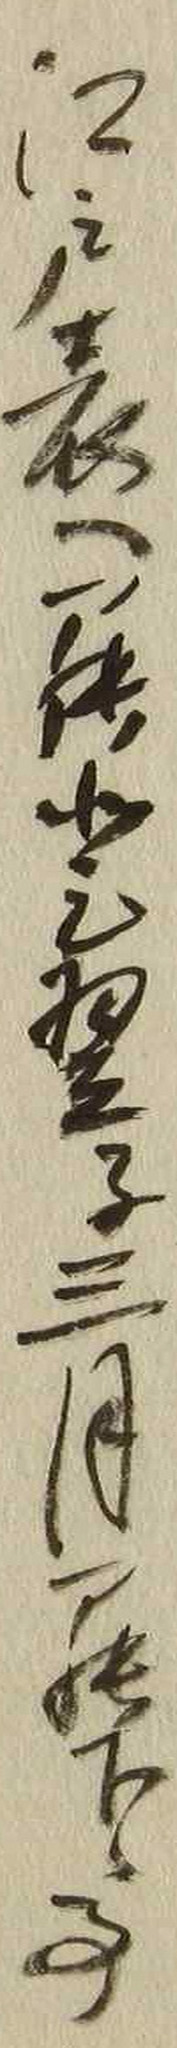江戸表へ罷登翌子三月罷下候事
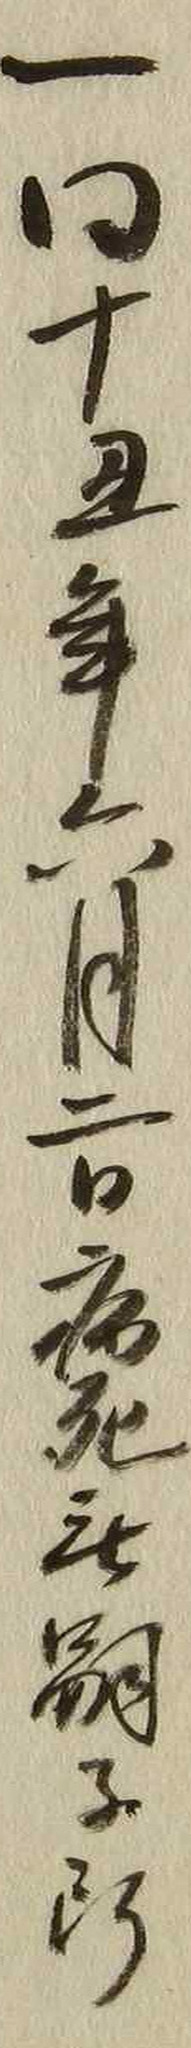一同十丑年六月二日病死無嗣子断
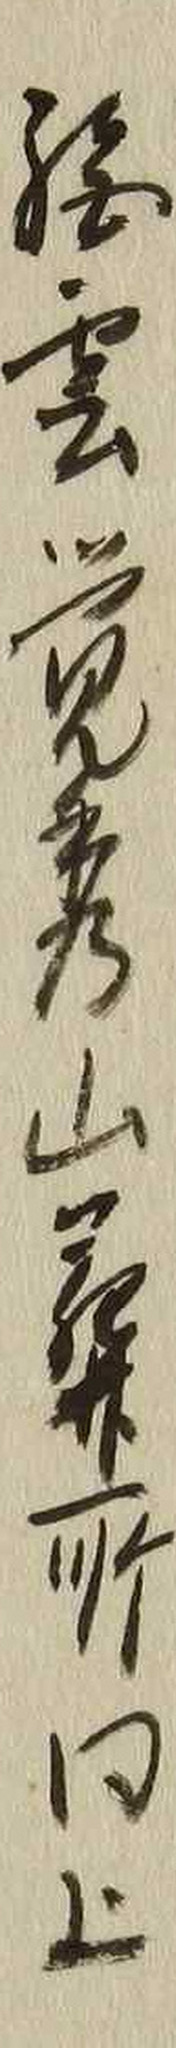絶霊覚秀山葬所同上
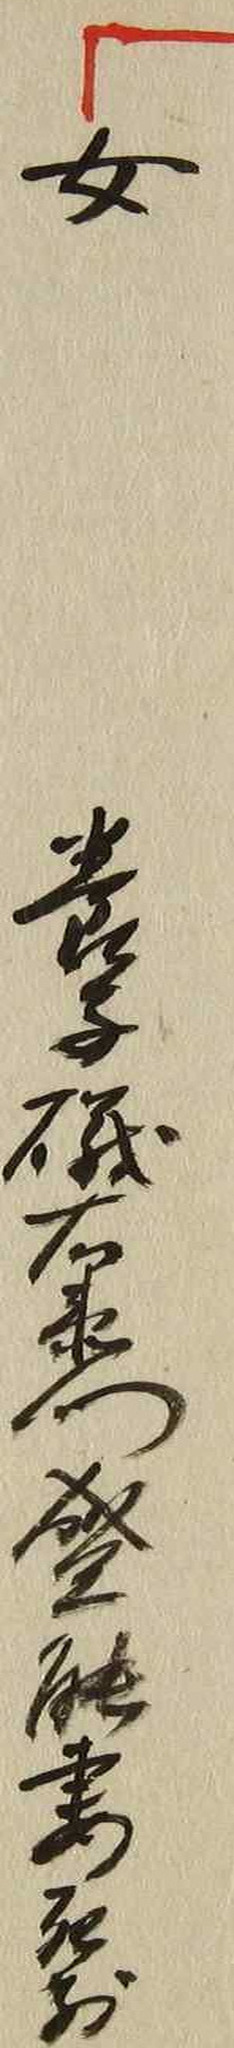女養子磯右衛門盛能妻死別
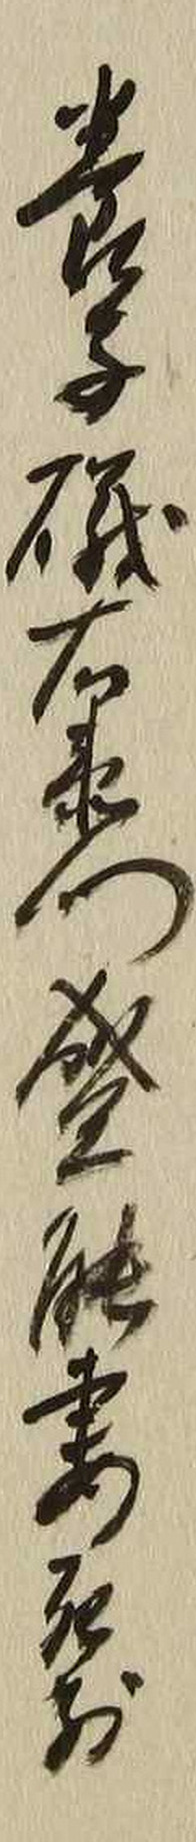女養子磯右衛門盛能妻死別
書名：諸士系譜　巻之360　す之部10
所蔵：会津若松市立会津図書館
